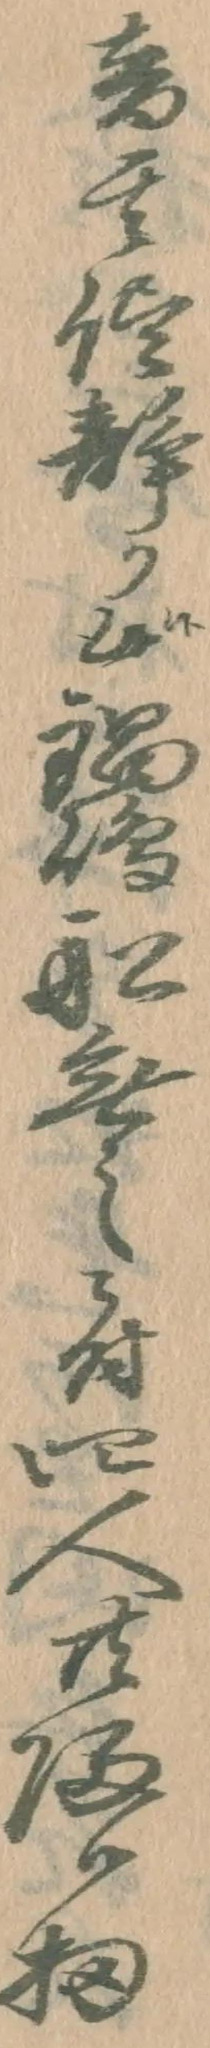音其侭静り候鍋島舩無之に付余人共帰候扨
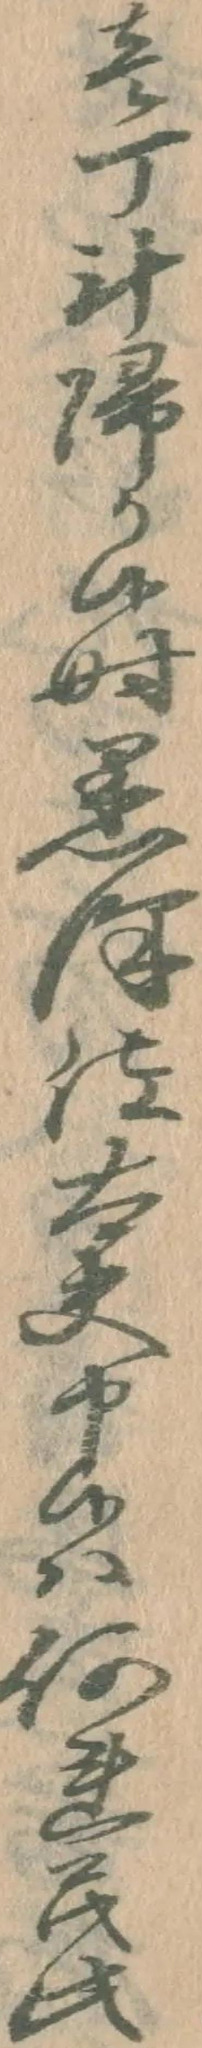壱丁斗帰り候時黒沢佐太夫申候は何連茂此
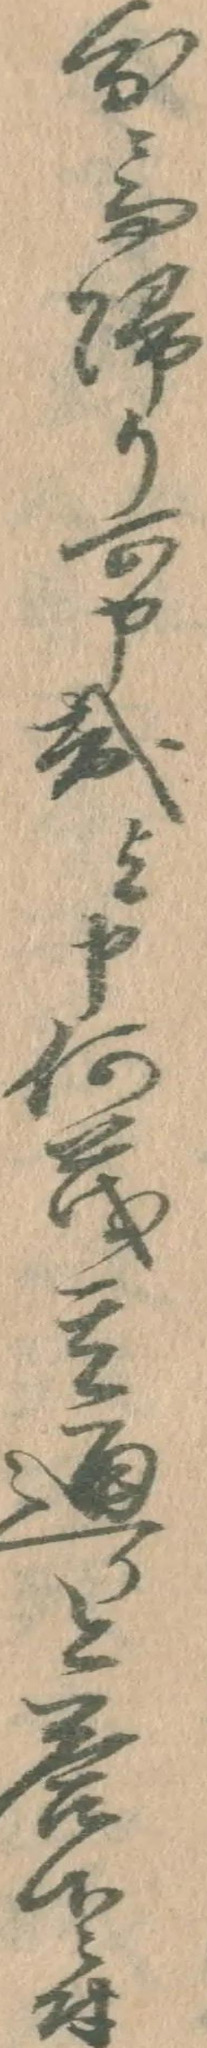分に而帰り可申哉与申何茂其通りと答候に付
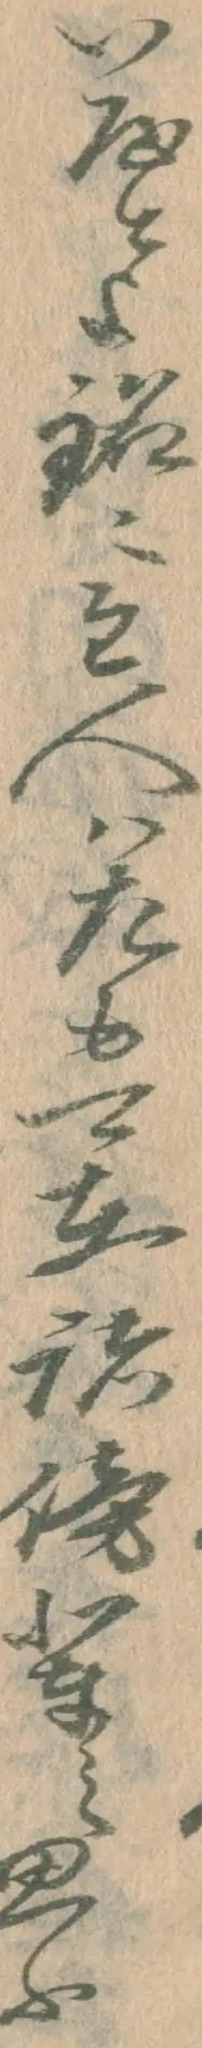い屋とよ銘々主人は左も可在諸傍輩之思ふ
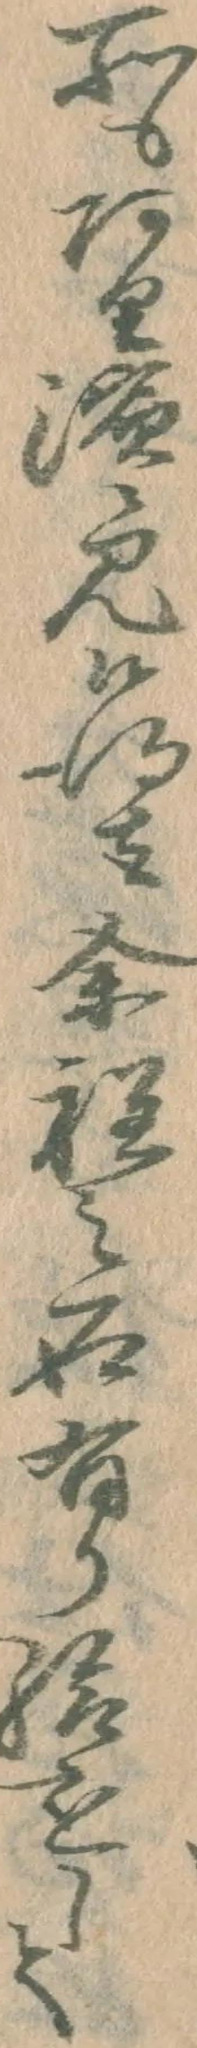所も阿里浜に見候得者余程之石有り給をして
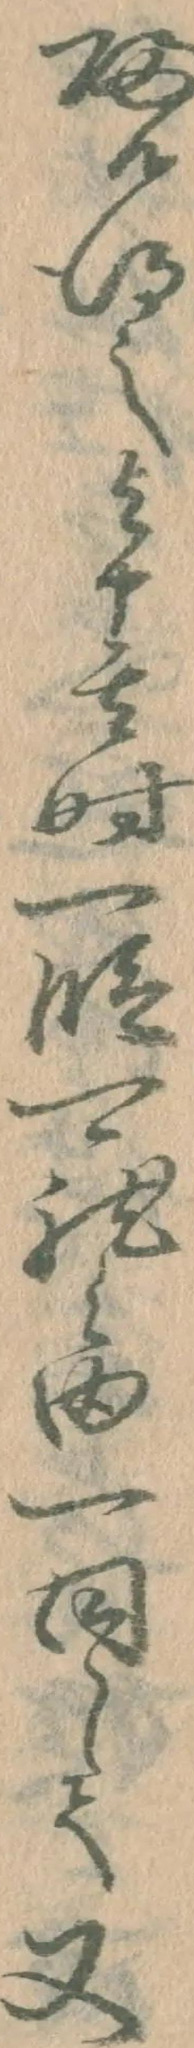帰候得し与申其時一段可然之由一同して又
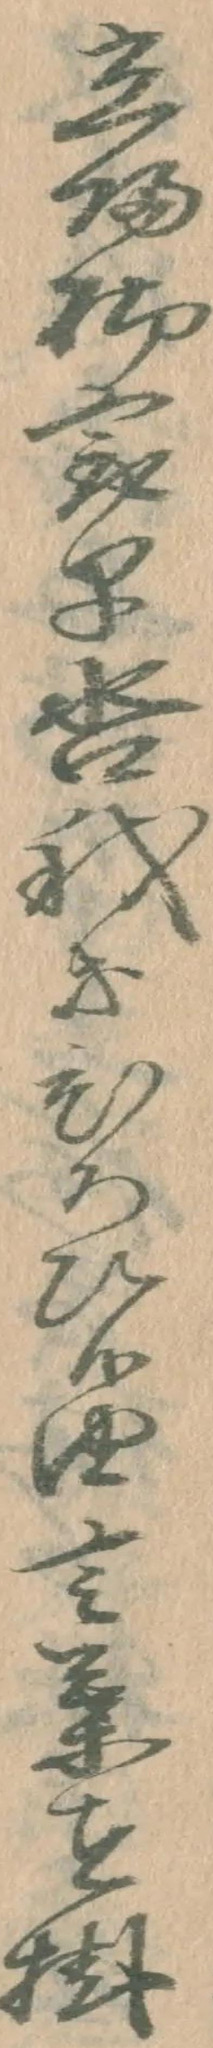立帰砌最早呇我等ひろひ候由言葉を掛
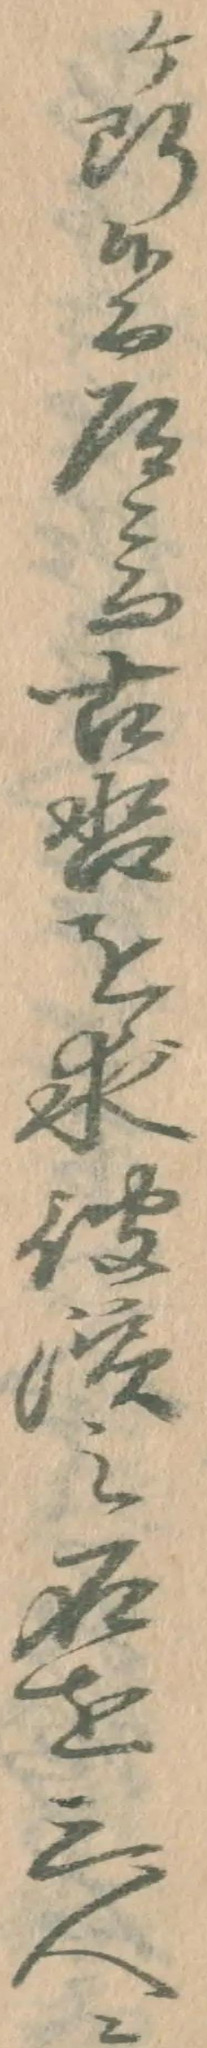け断候而道に而古呇を求彼浜之石を三人に

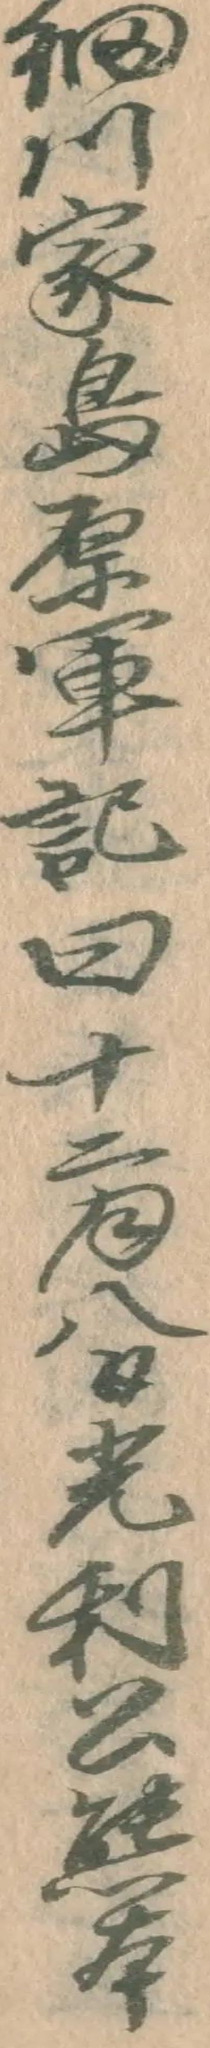細川家島原軍記曰十二月八日光利公熊本
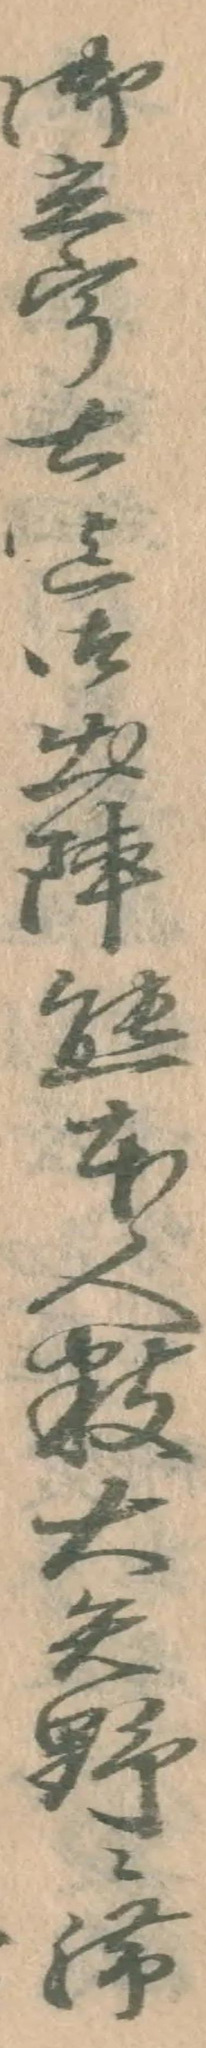御立宇土迄御出陣熊本人数大矢野に滞
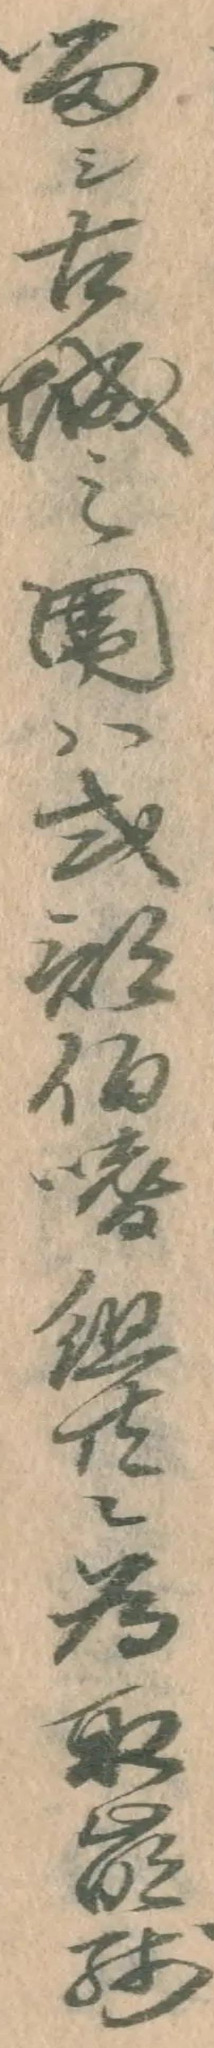留し古城之国は式部伯耆組共に為取崩残
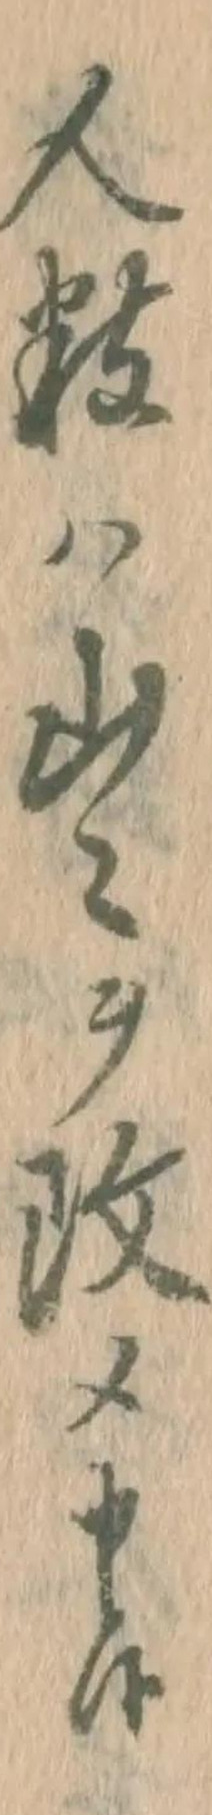人数は山々を改め申候
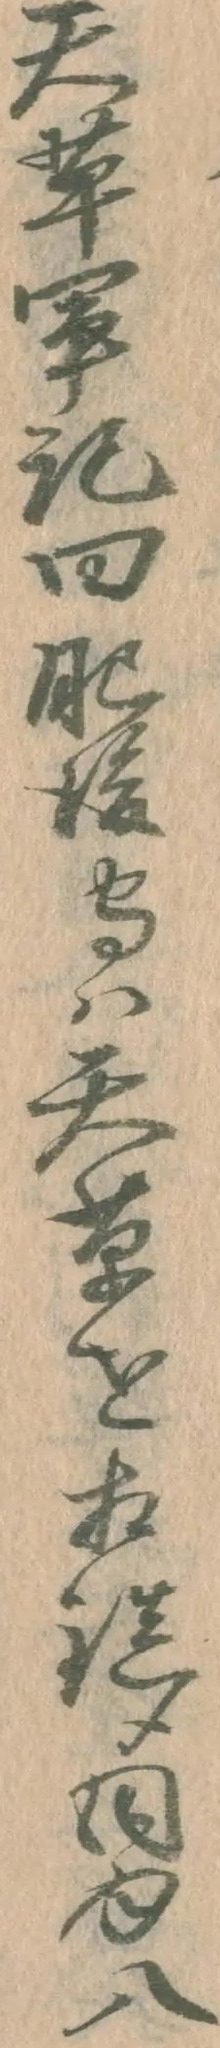天草軍記曰肥後守は天草を相鎮め同月八
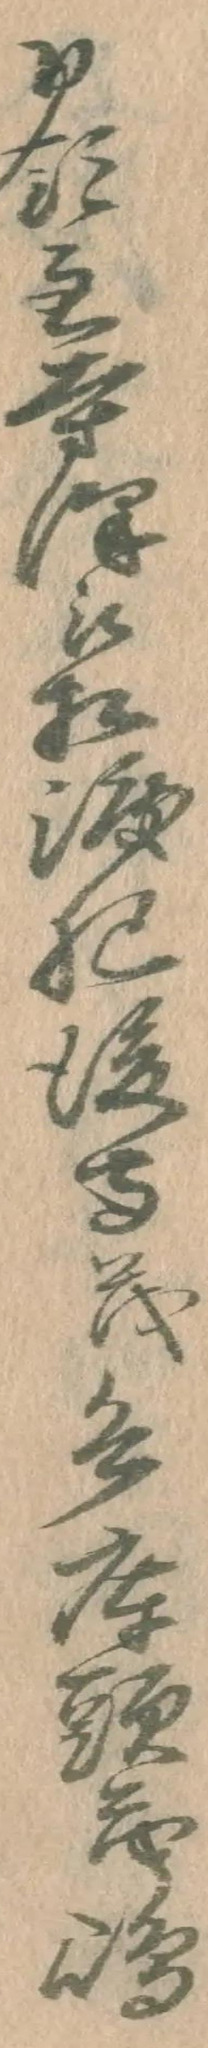日領主寺沢江相渡肥後守茂兵庫頭茂島
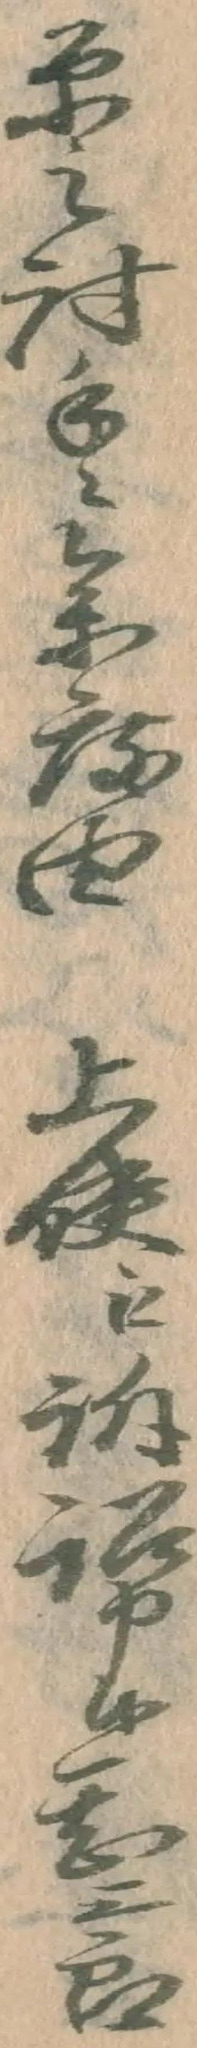原に討手に参度由上使江訴訟申候甚三郎
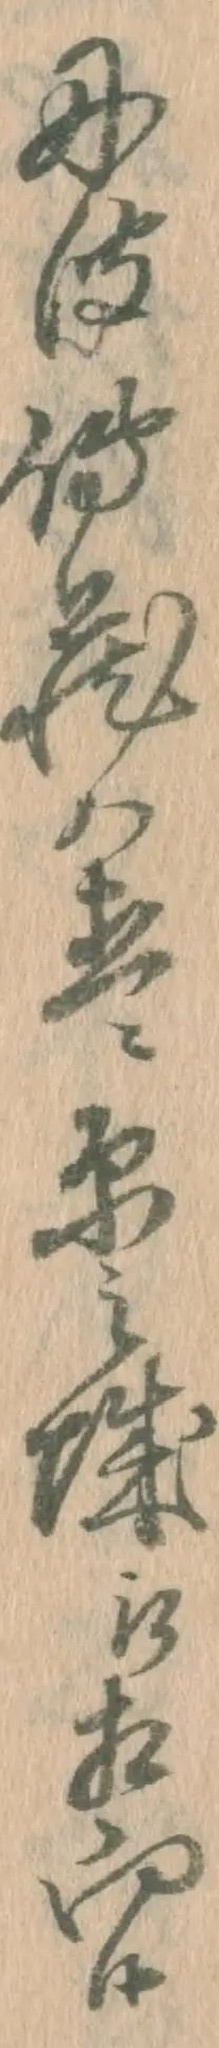丹波伝蔵は直に原之城江相向候
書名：切支丹御退治記 49巻. [4]
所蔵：国立国会図書館 National Diet Library, JAPAN
